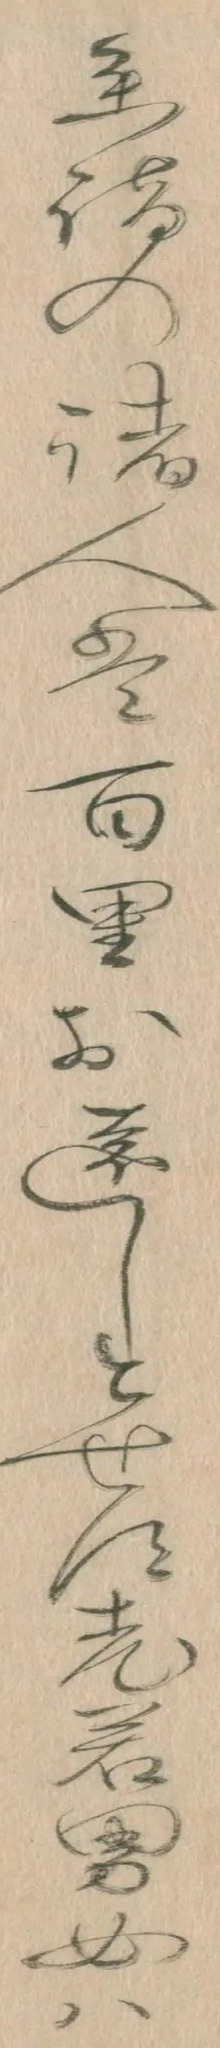参詣の諸人は百里お遠しとせす老若男女は
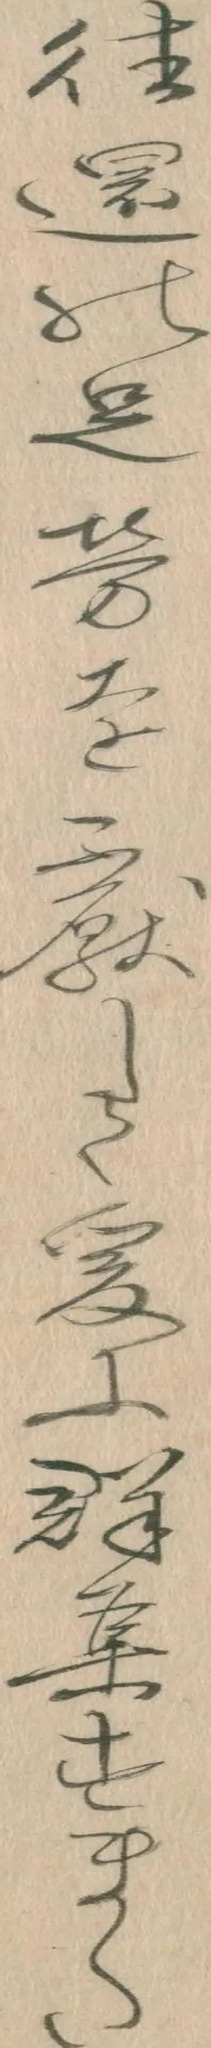王還の足労を不厭して爰に群集すまた
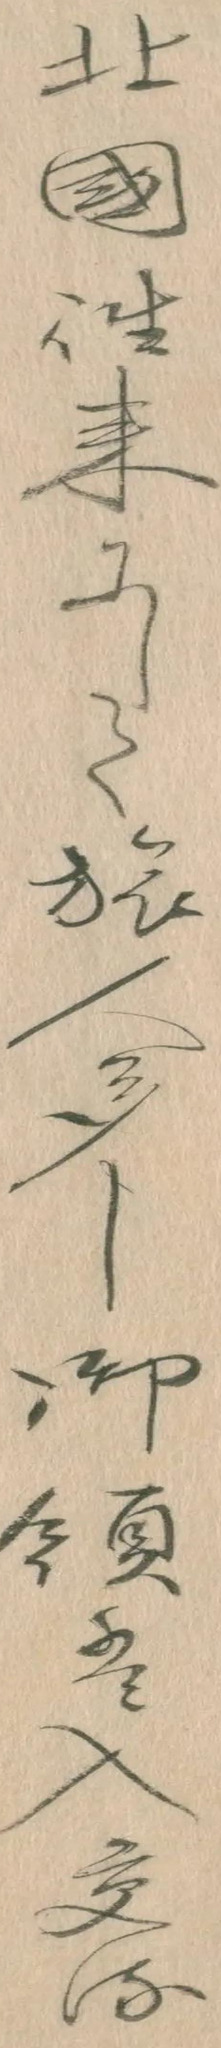北国往来にして旅人多し御領は入交る
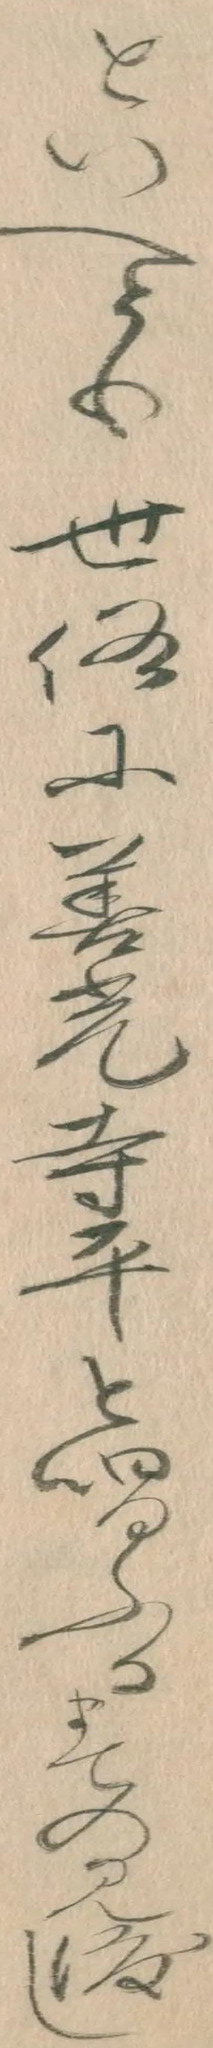といへとも世俗に善光寺平と唱ふるまての見渡し
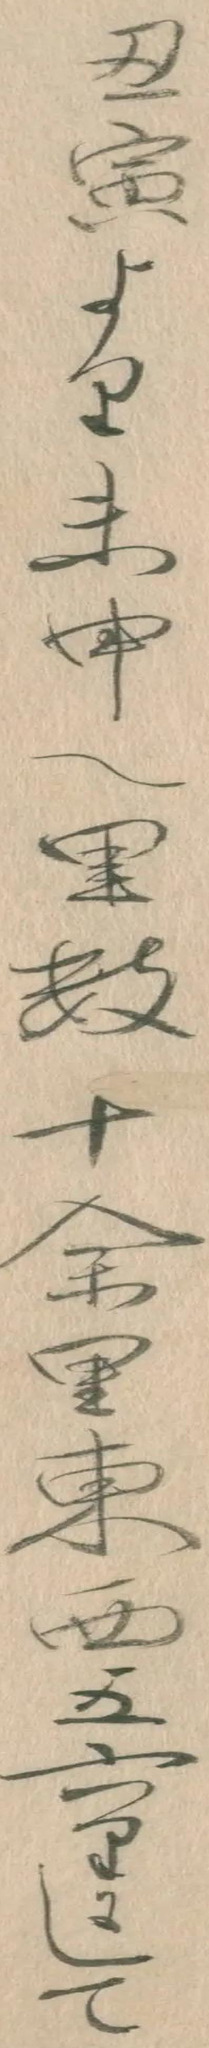丑寅より未申へ里数十余里東西五六里にして
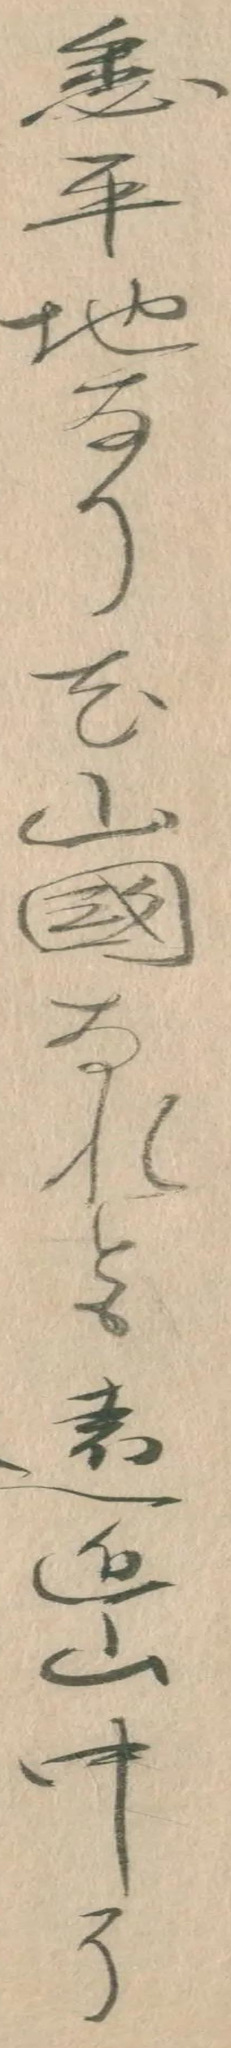悉平地なり山国なれとも遠近山中に

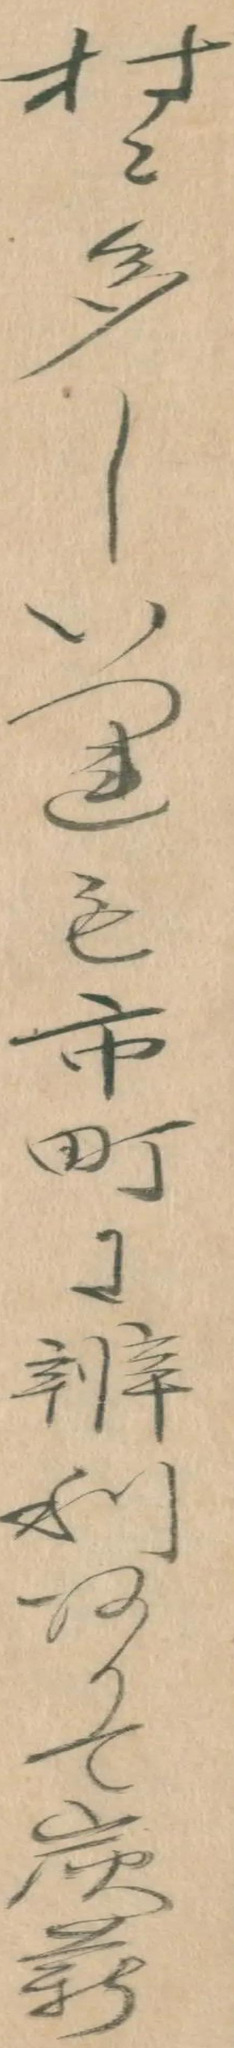村々多しいつれも市町ｎに弁利ありて炭薪
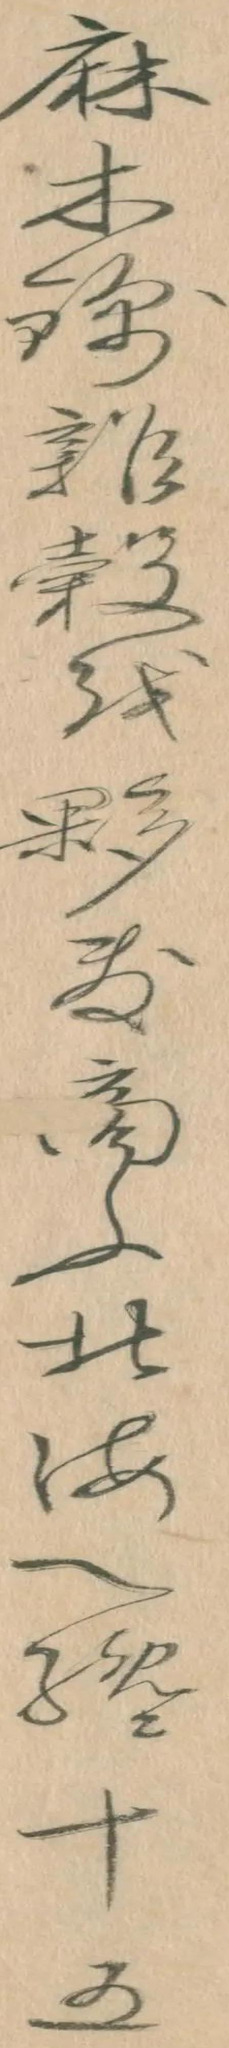麻木綿雑穀を夥敷商ふ北海へ纔十五
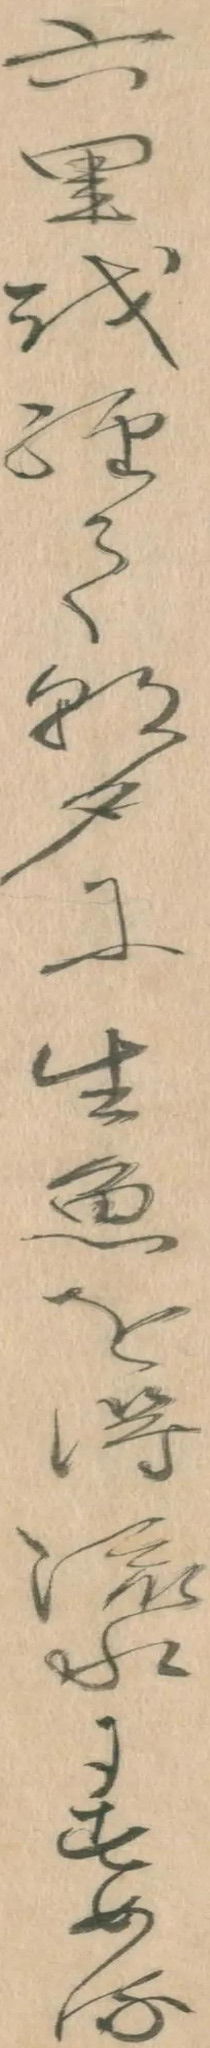六里を経て朝夕に生魚を得流水にすめる
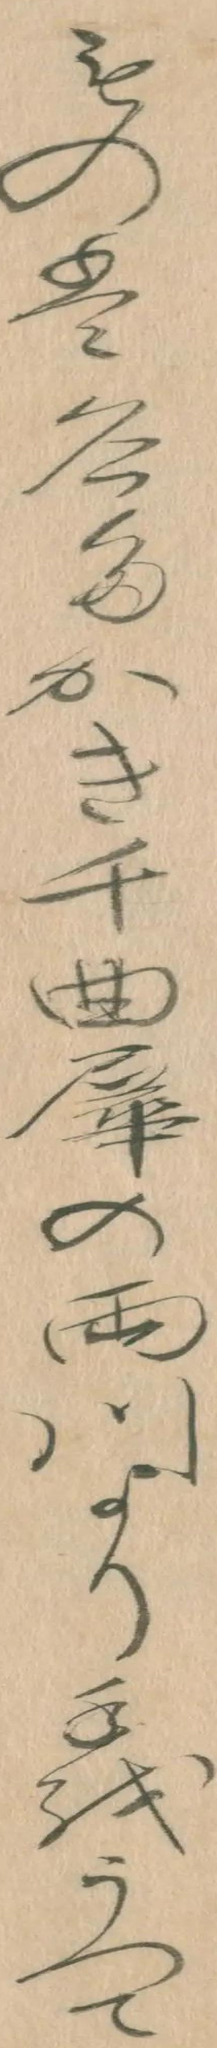ものは名たかき千曲犀の両川より手をうつて
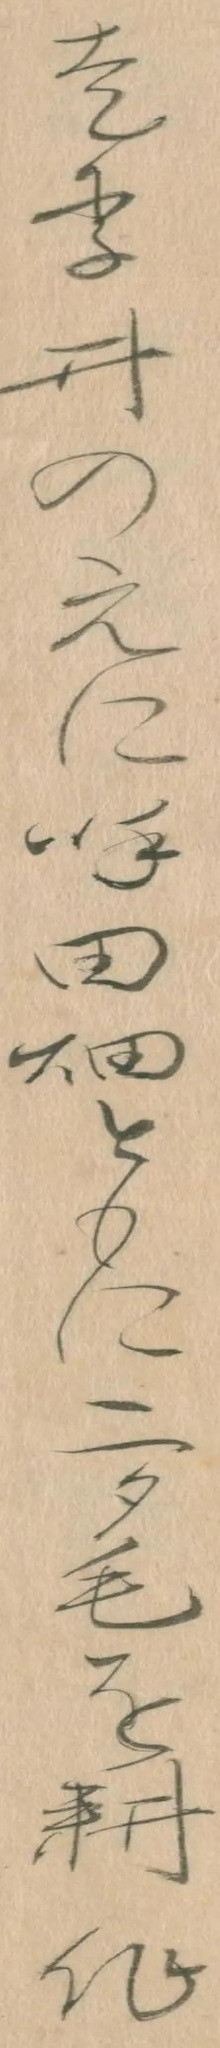走り井の本に呼田畑ともにニタ毛を耕作
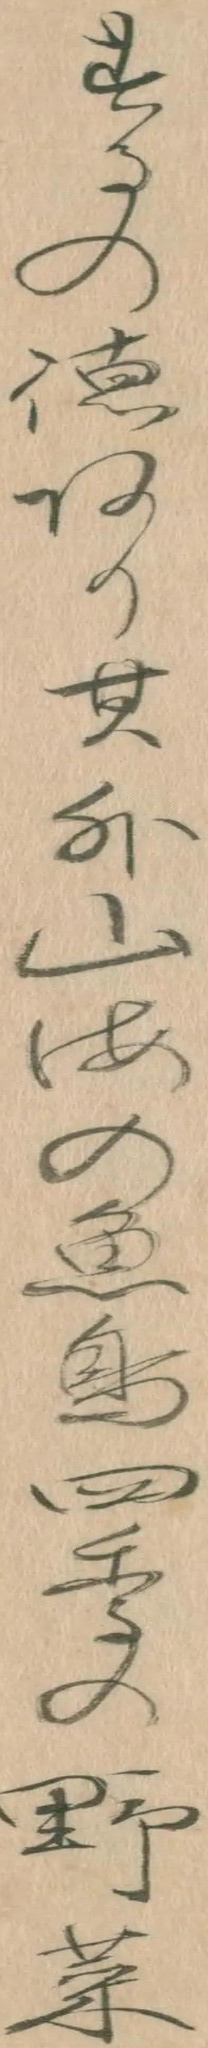するの徳あり其外山海の魚鳥四季の野菜
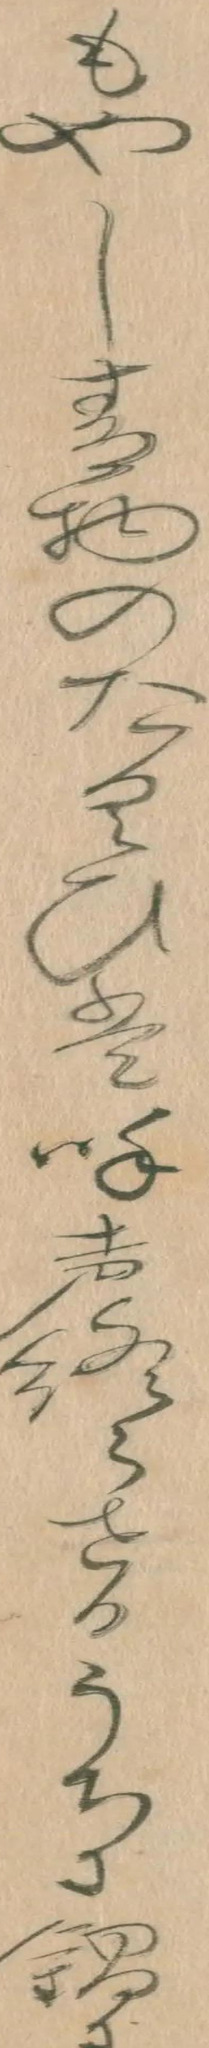もやし青物のたくひは呼声終らせるうちに鍋に
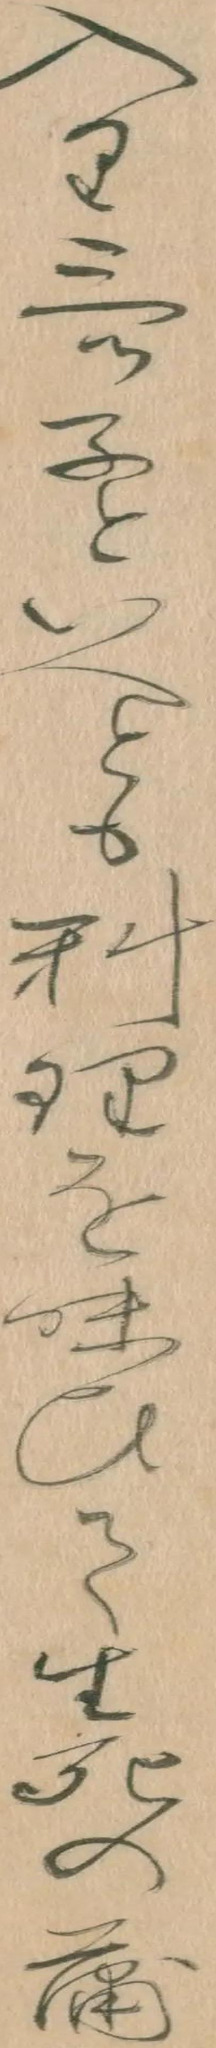入り三ッ子といへとも料理を味ひて生死の蒲
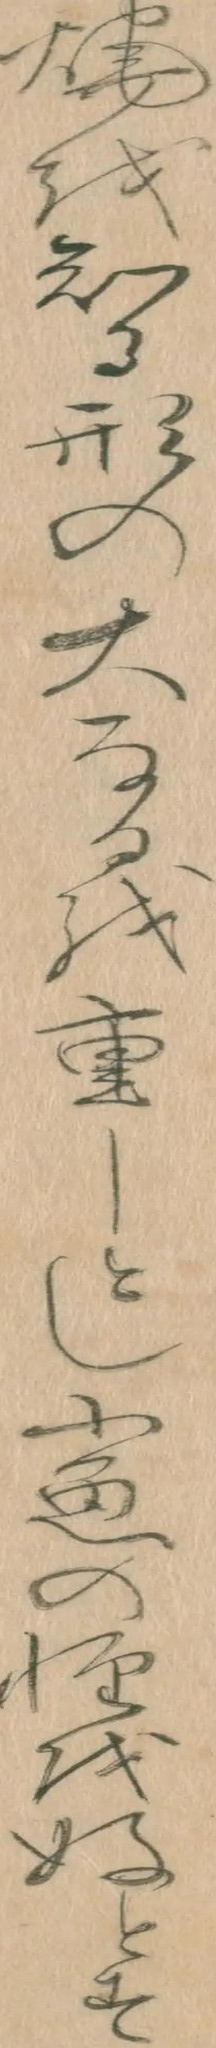焼を知る形の大なるを重しとし小魚の軽を好とす
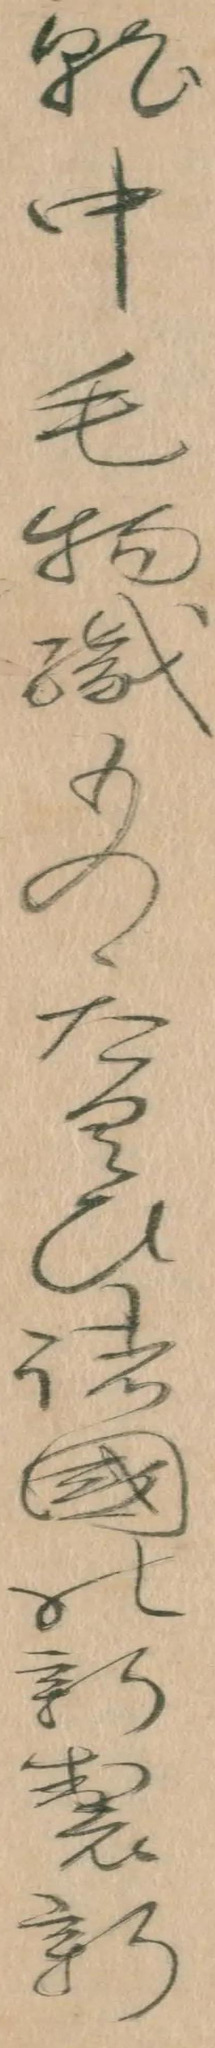就中化物織ものやくひ諸国の新製新
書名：俗語之種. [1]
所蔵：国立国会図書館 National Diet Library, JAPAN
